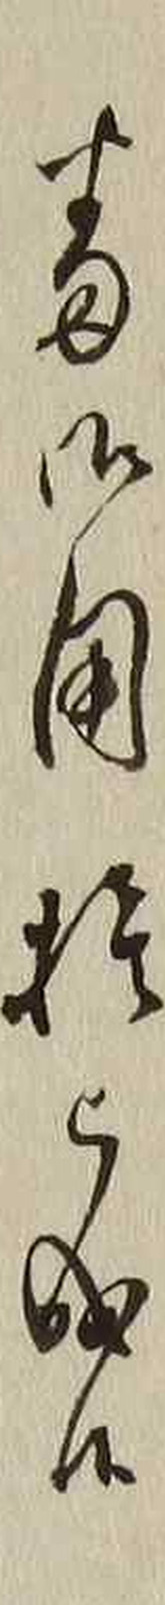番御用捨被成候
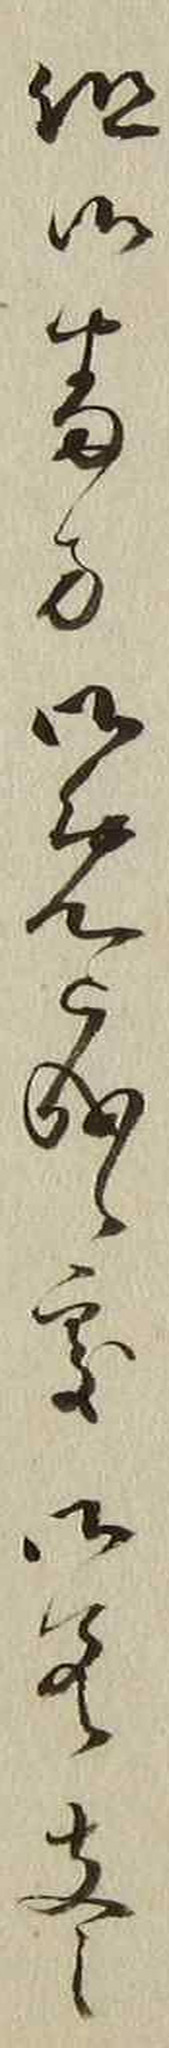但御番方御免被成候処御差支之
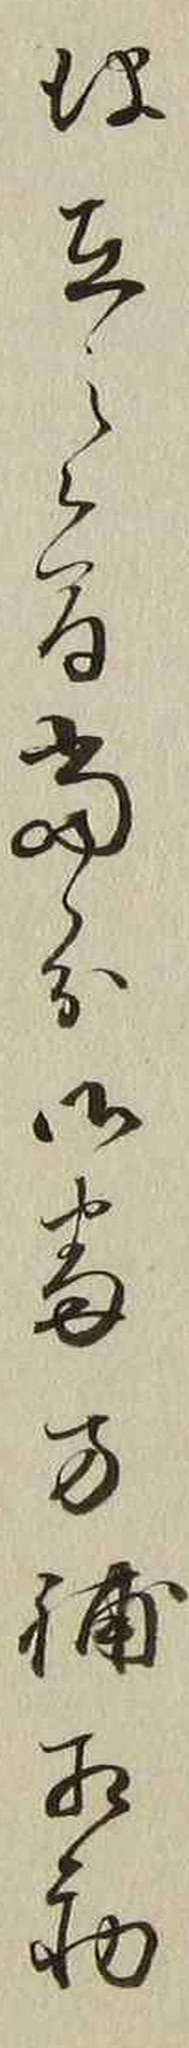儀在之候間当分御番方補相勤
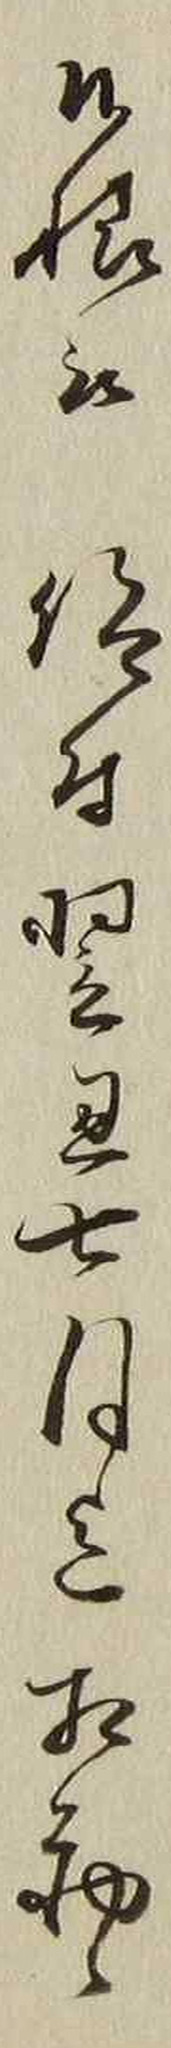候様被仰付翌丑七月迄相勤候
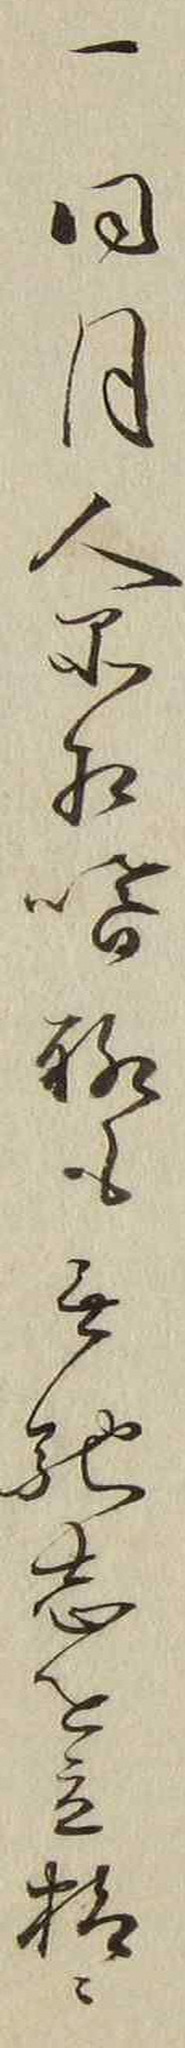一同月人品相嗜聊も無馳志を立精々
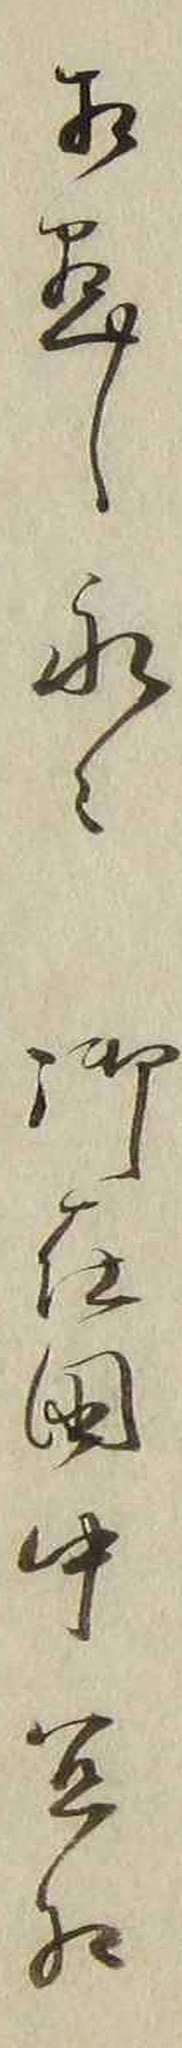相尽し永々御在国中宜相

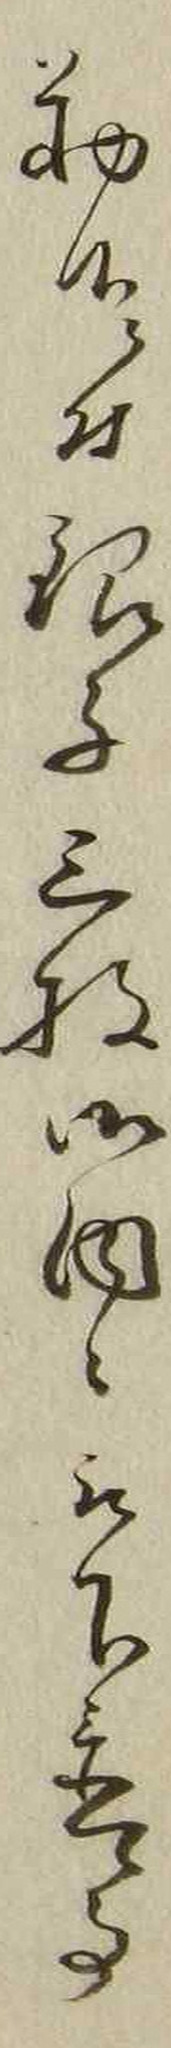勤候ニ付銀子三枚御内々被下置候事
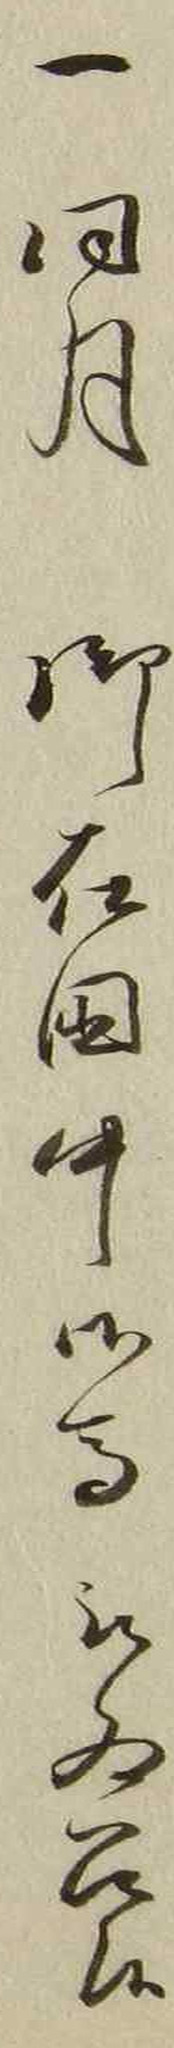一同月御在国中御馬被為召候
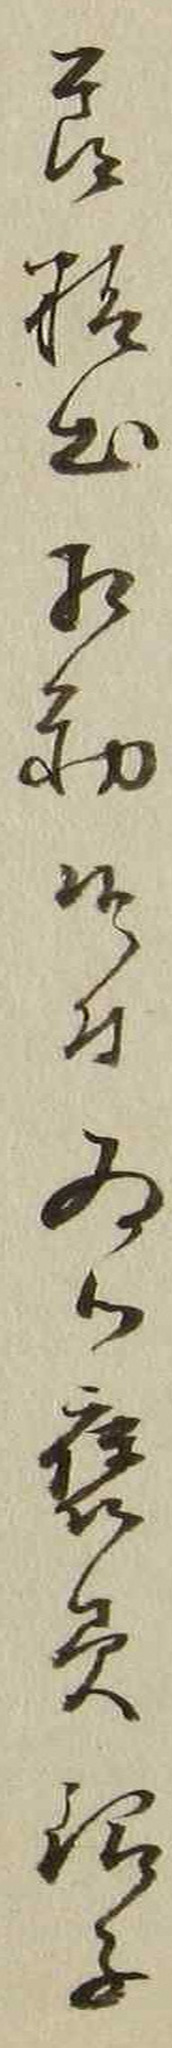節精出相勤候ニ付為御褒美銀子
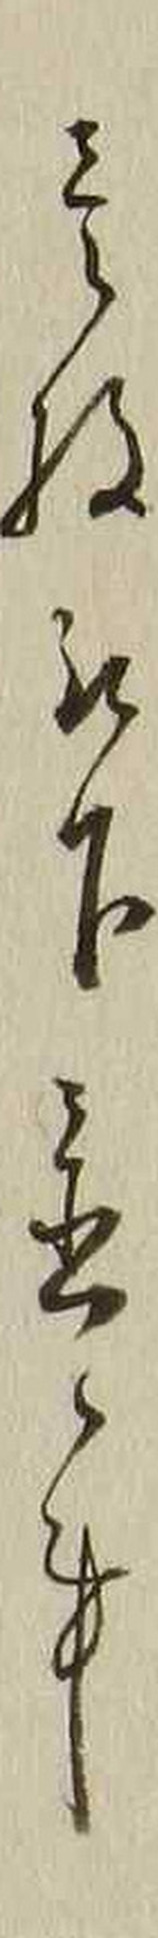壱枚被下置候事
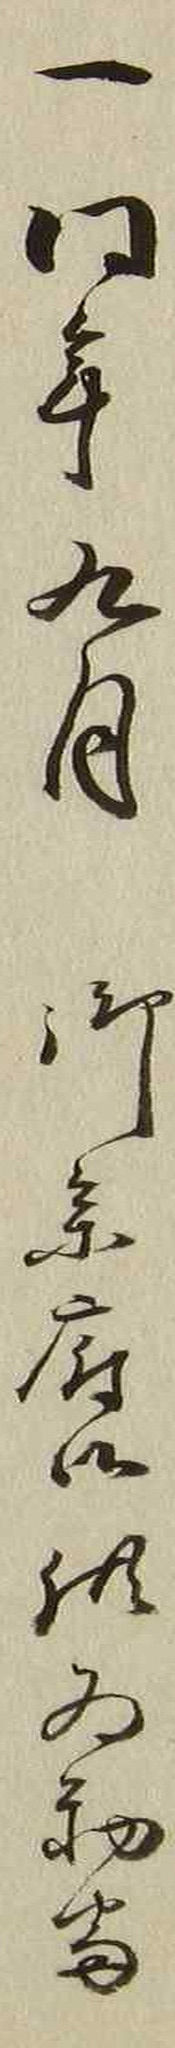一同年九月御参府御供為勤番
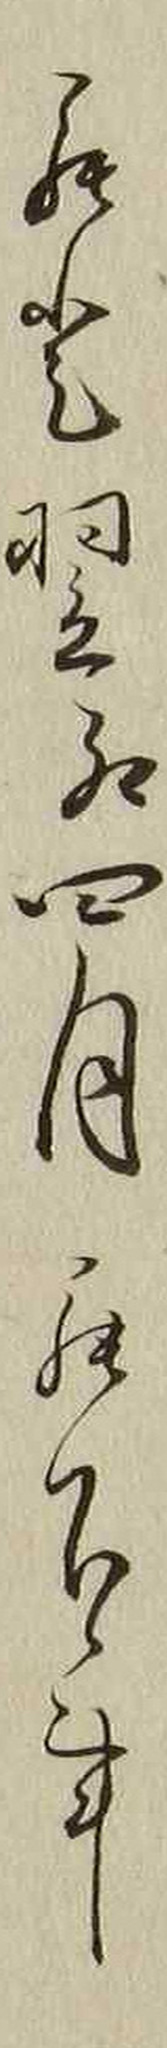罷登翌卯四月罷下候事
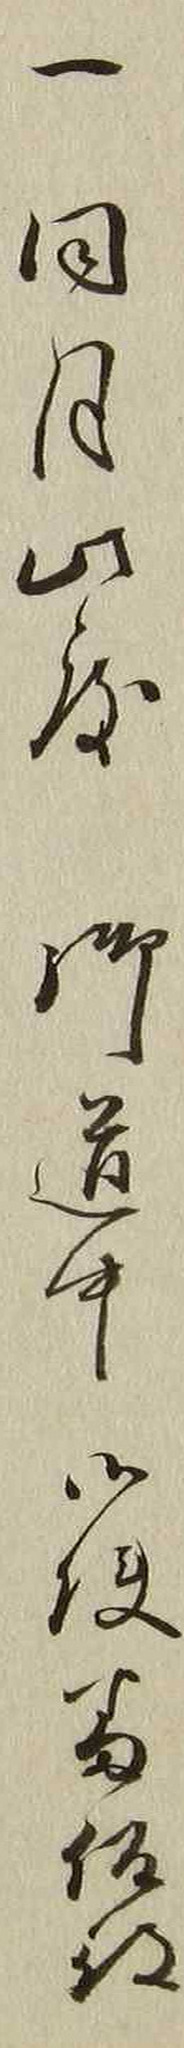一同月此度御道中御使番仮役
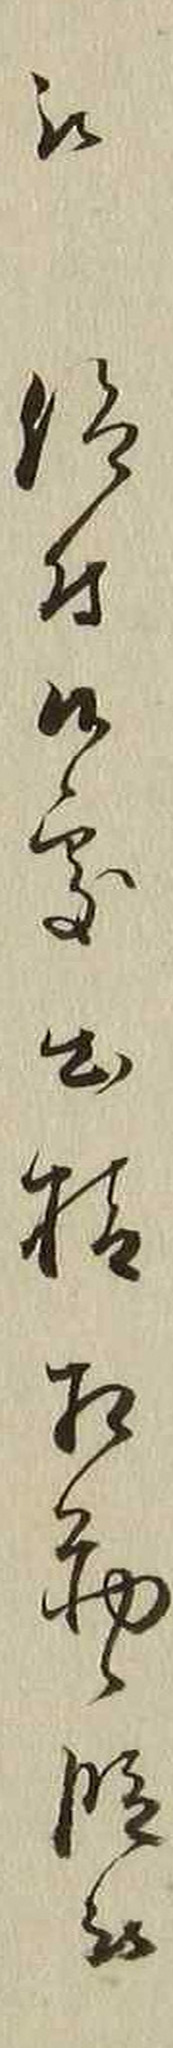被仰付候処出精相勤候段被
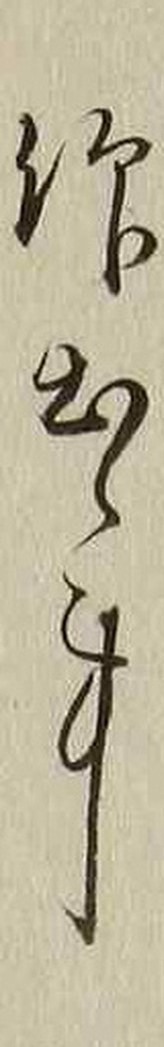仰出候事
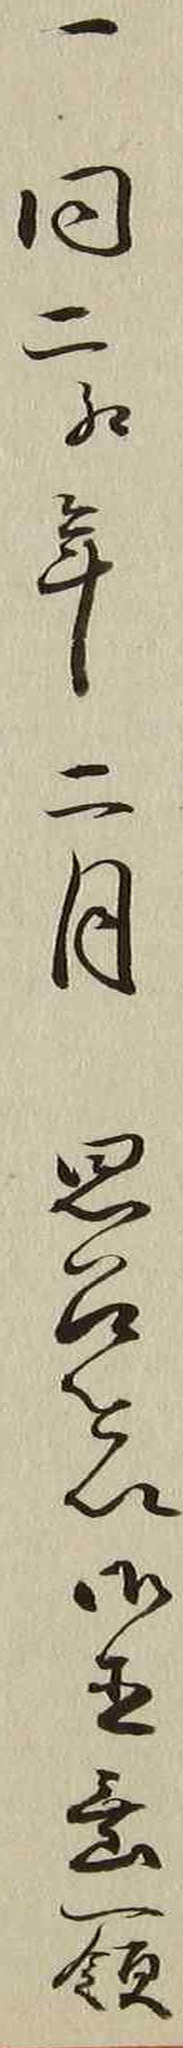一同二卯年二月思召を以御直垂一領
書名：諸士系譜　巻之25　い之部25
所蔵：会津若松市立会津図書館
